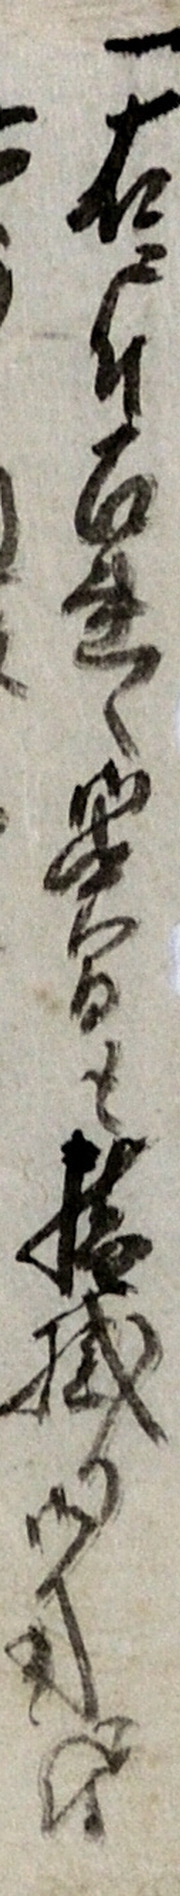一右ニ付召連候御中間も指掛り御用ニ付
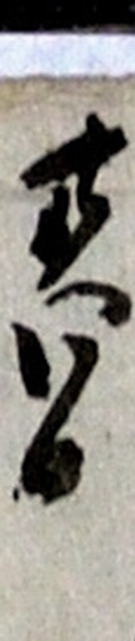廿五日
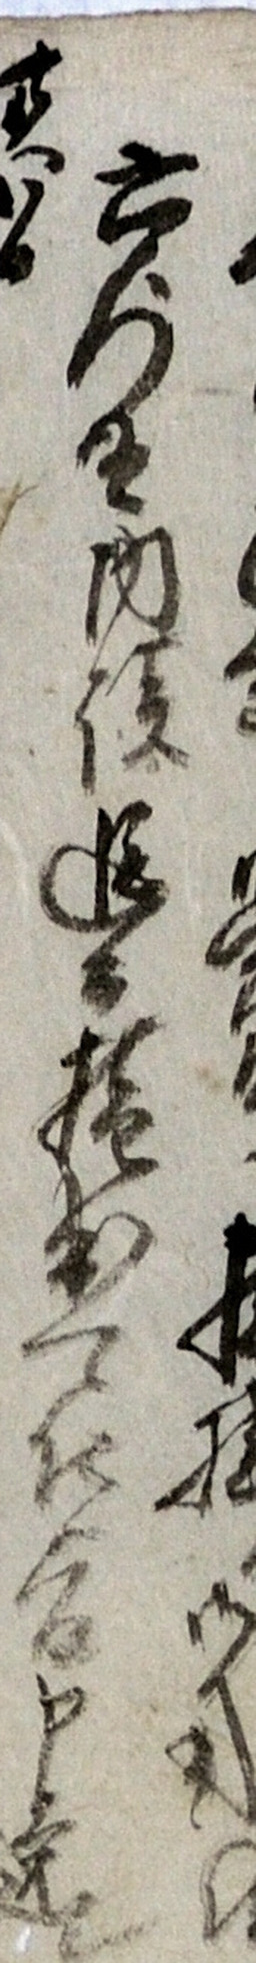六右衛門と内談追而指出可仕旨申達候
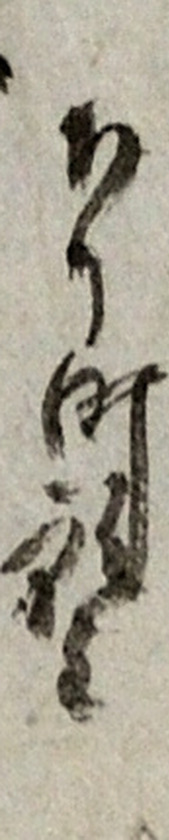下り町願主
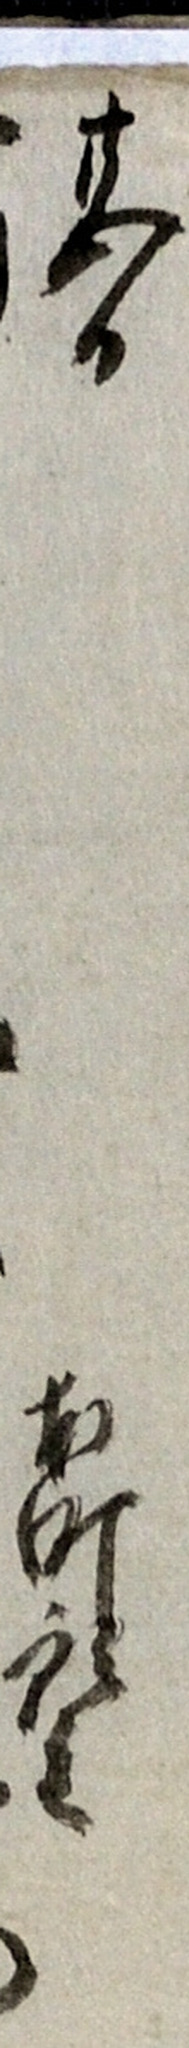廿五日本町願主
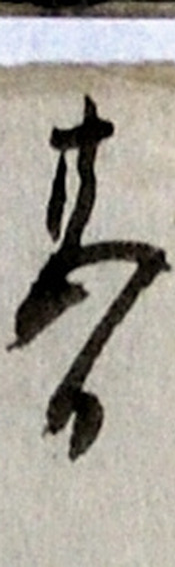廿五日
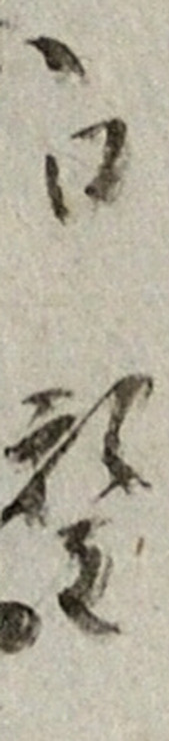同願主
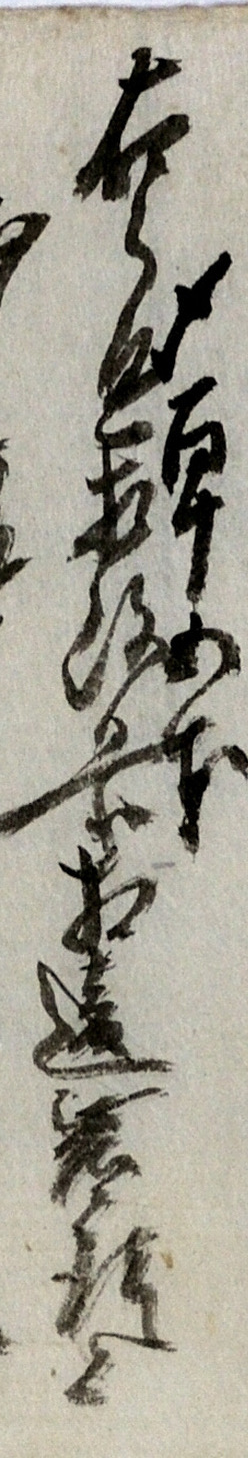右之通相改候所相違無御座候以上
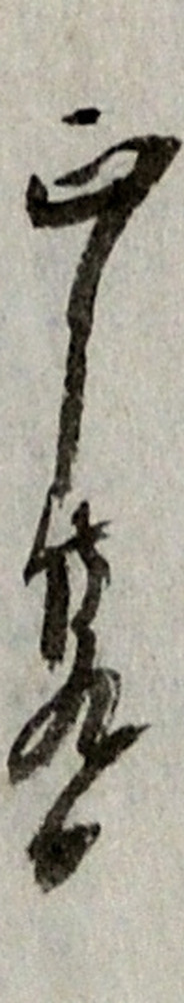正月廿九日
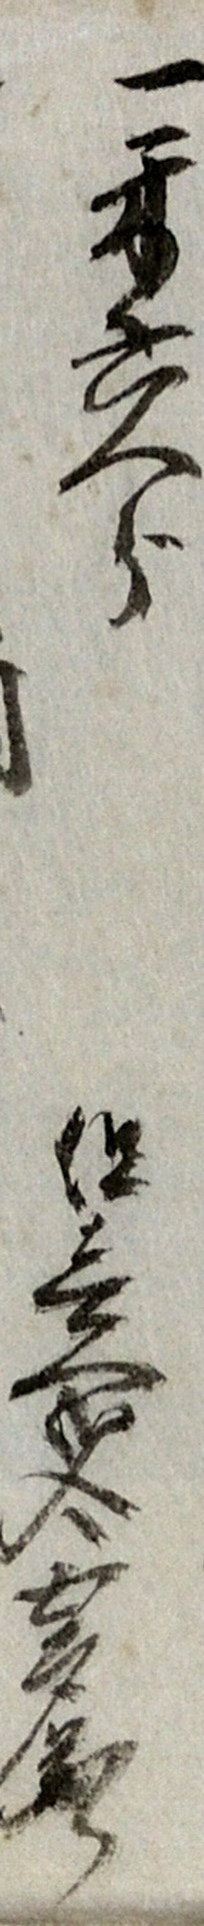一米六人分但壱人弐合七勺図り
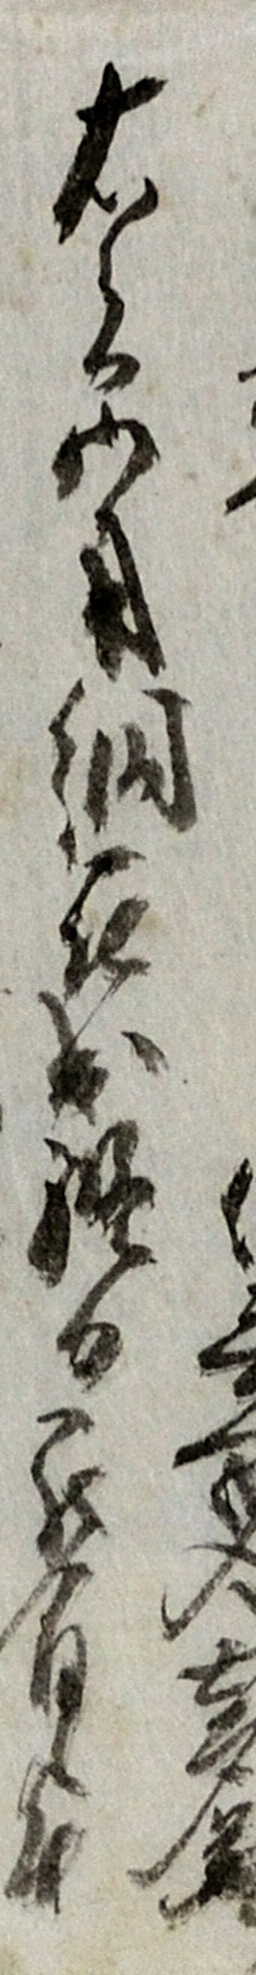右は御用網罷出終日罷有候付
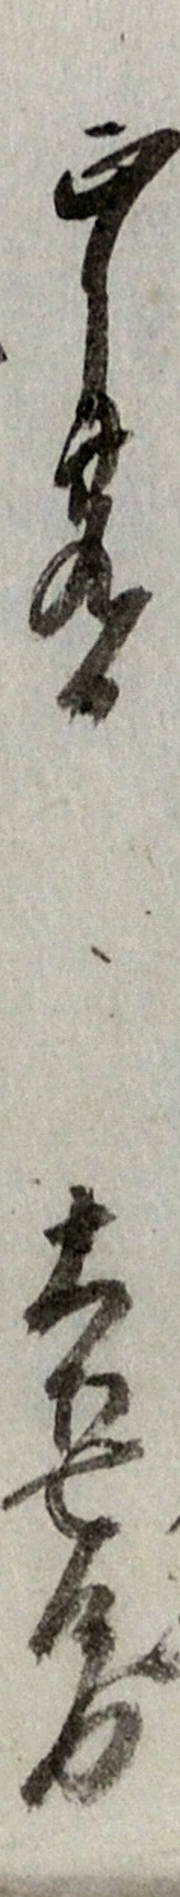正月廿九日大下七左衛門
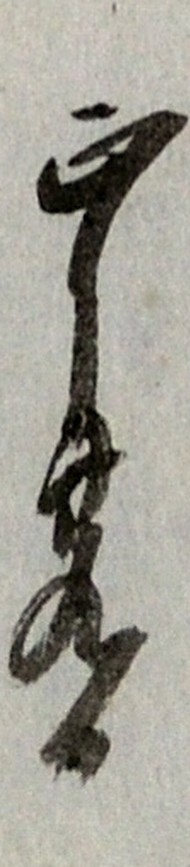正月廿九日
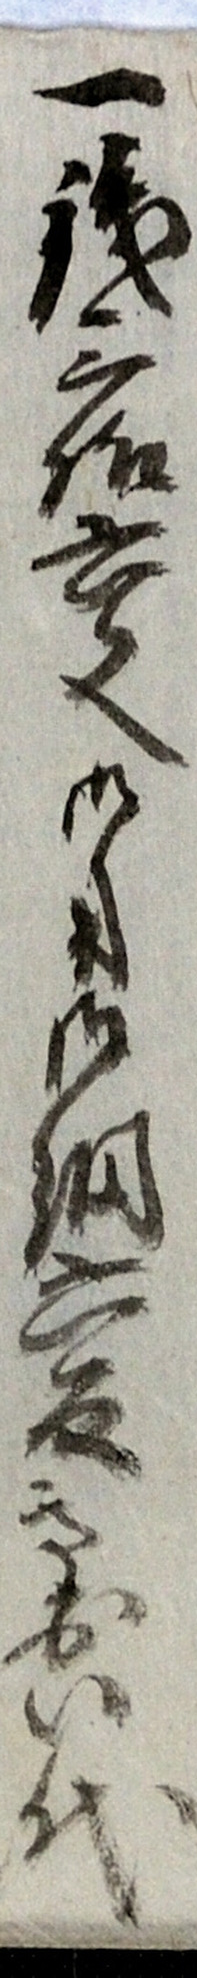一銭三拾六文御用御網六反きおい代
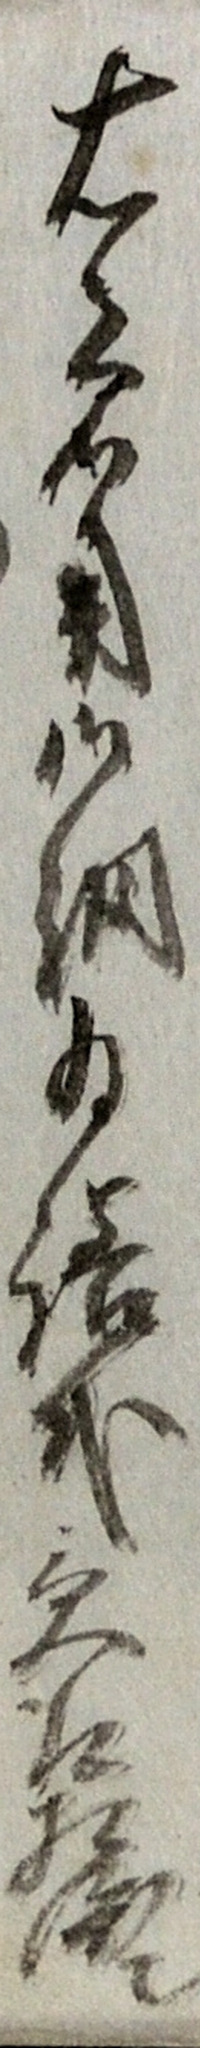右は御用御網為繕代受取相渡し
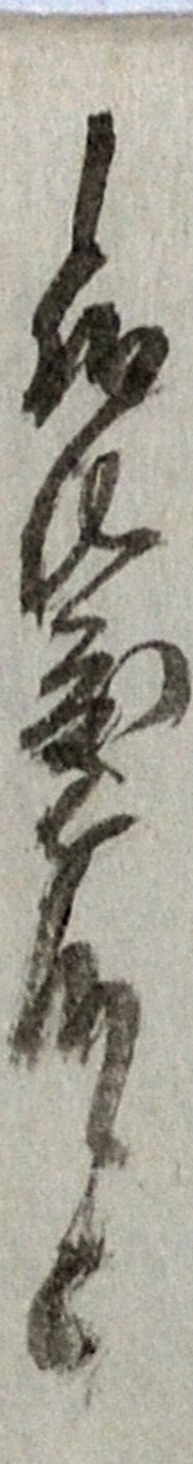候様仕度奉存候以上
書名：分一方諸事御用留帳
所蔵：伊那市立高遠町図書館・合同会社AMANE
